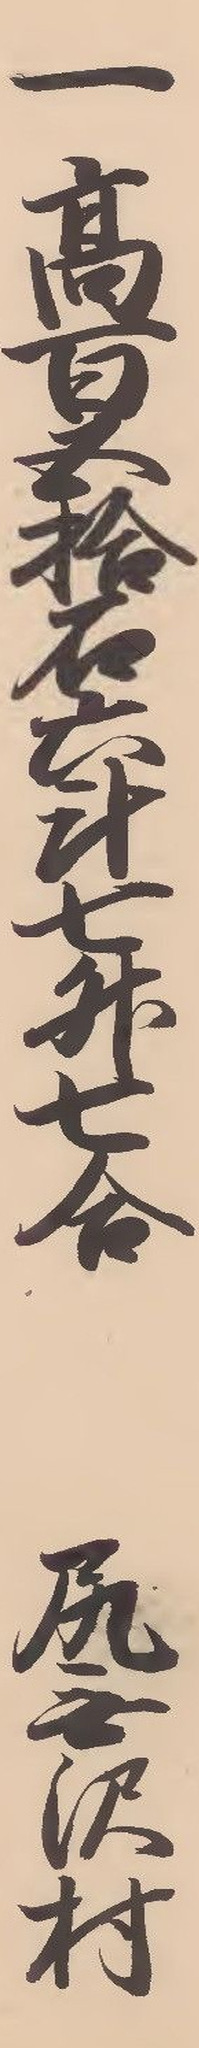一高百五拾石六斗七升七合尻無沢村
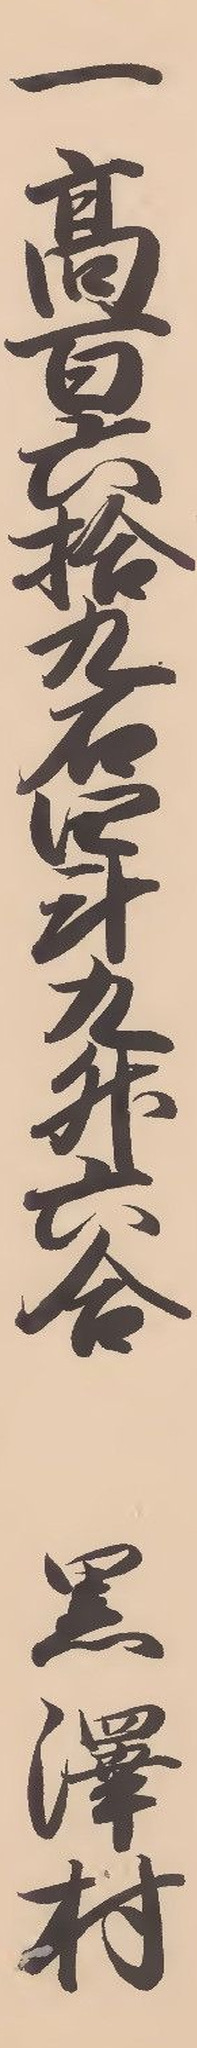一高百六拾九石四斗九升六合黒沢村
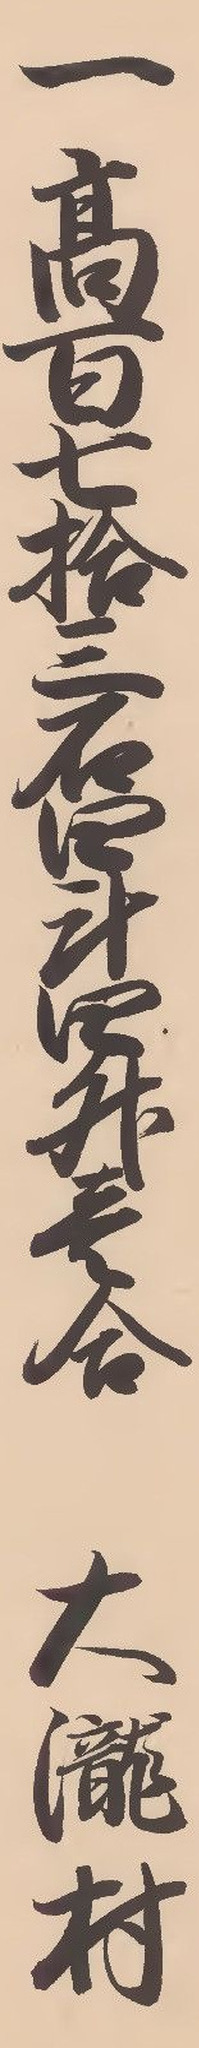一高百七拾三石四斗四升壱合大滝村
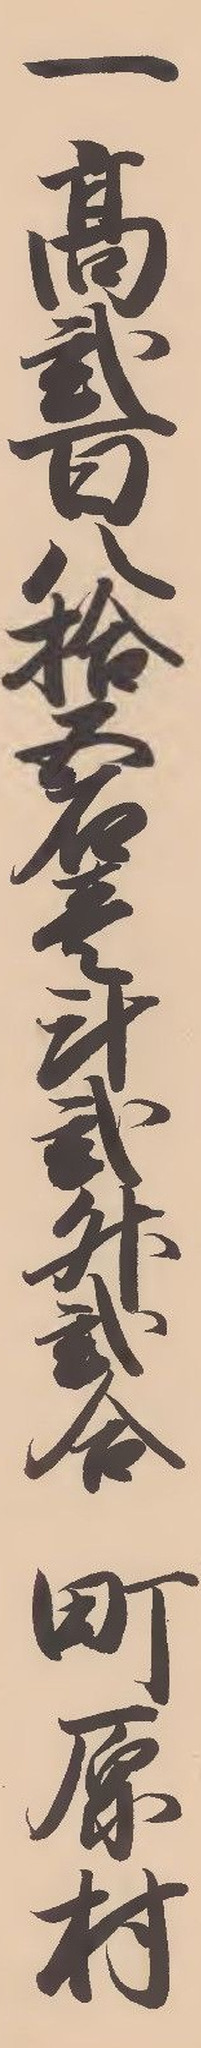一高弐百八拾五石壱斗弐升弐合町原村
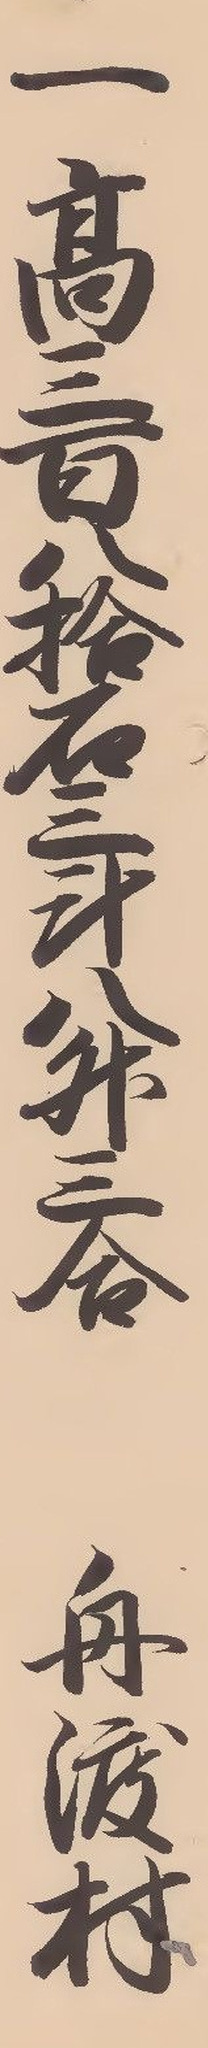一高三百八拾石三斗八升三合舟渡村
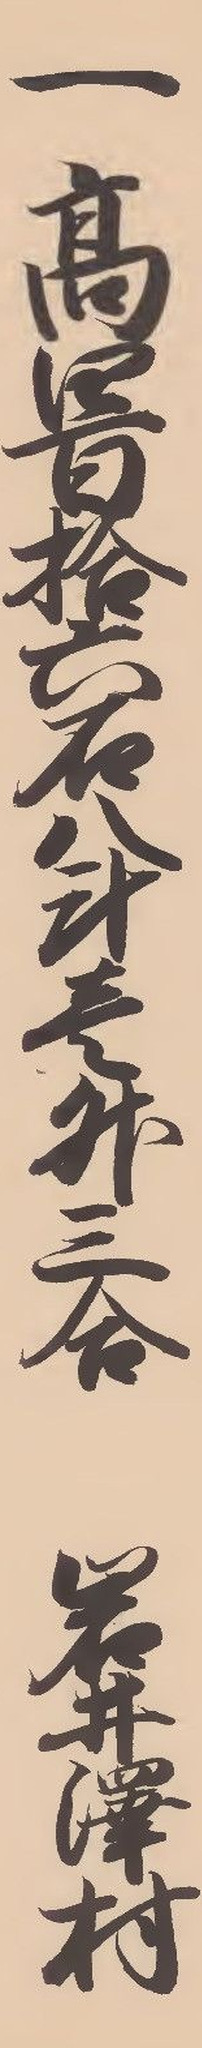一高四百拾六石八斗壱升三合岩井沢村
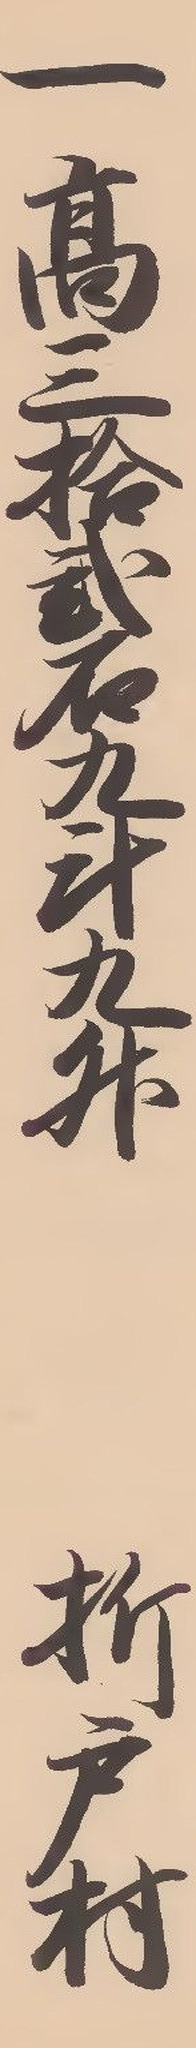一高三拾弐石九斗九升折戸村

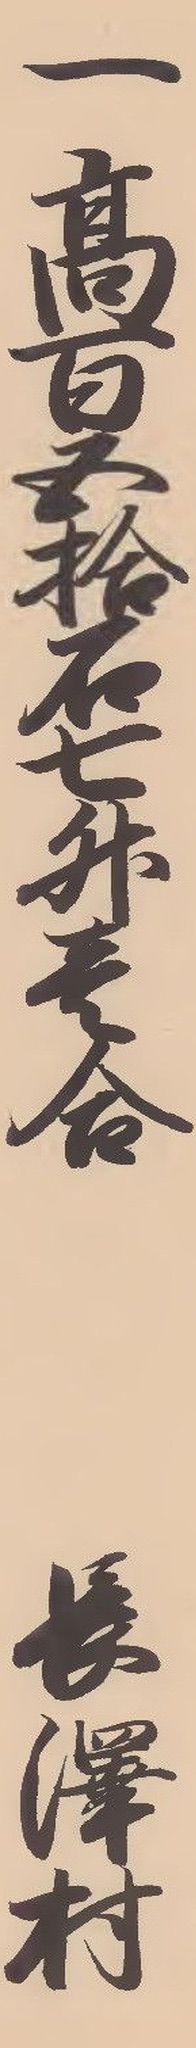一高百五拾石七升壱合長沢村
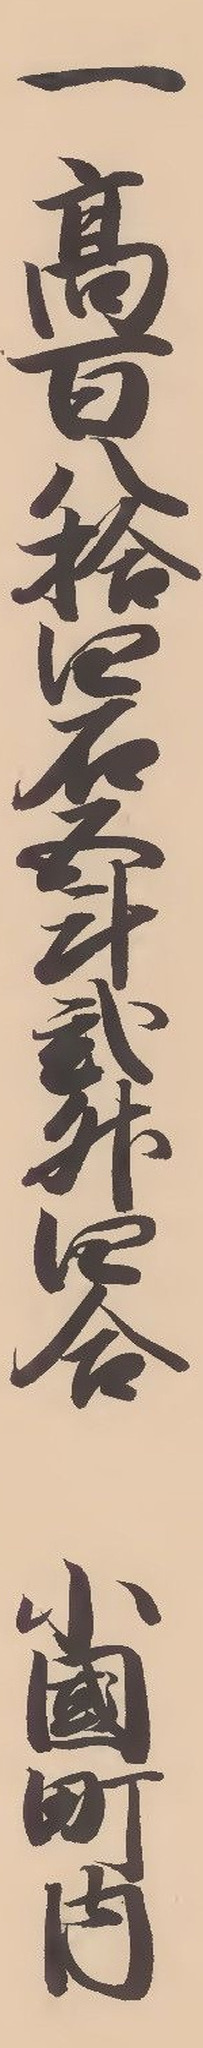一高百八拾四石五斗弐升四石小国内
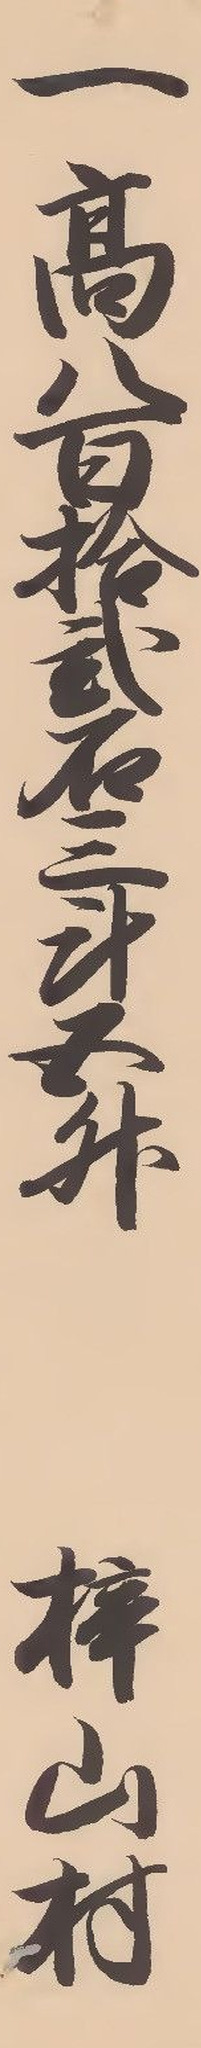一高八百拾弐石三斗五升梓山村
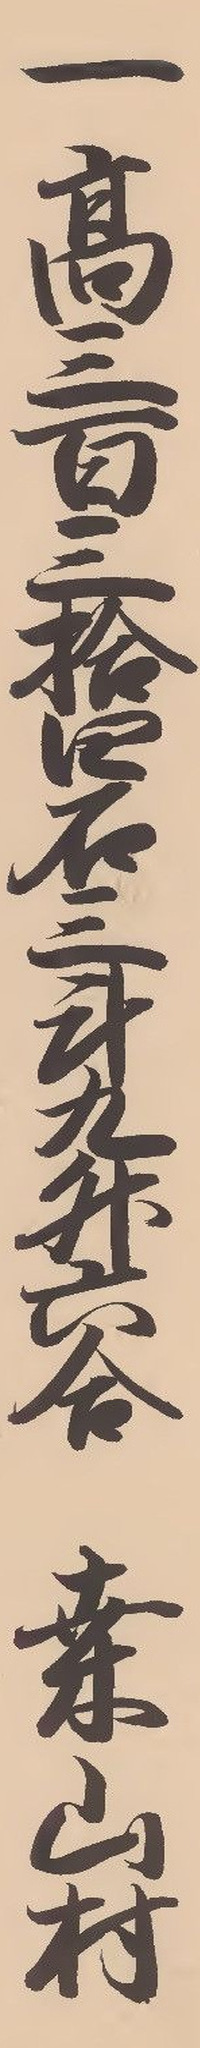一高三百三拾四石三斗九升六合桑山村
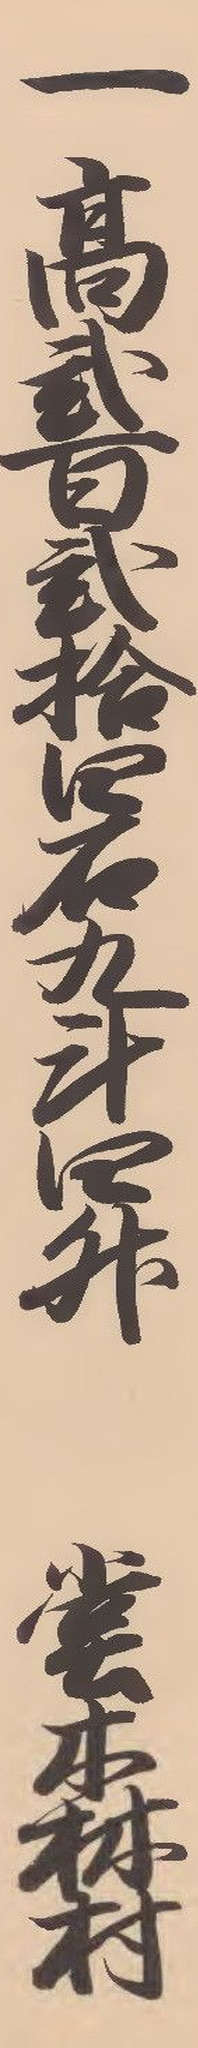一高弐百弐拾四石九斗四升堂森村
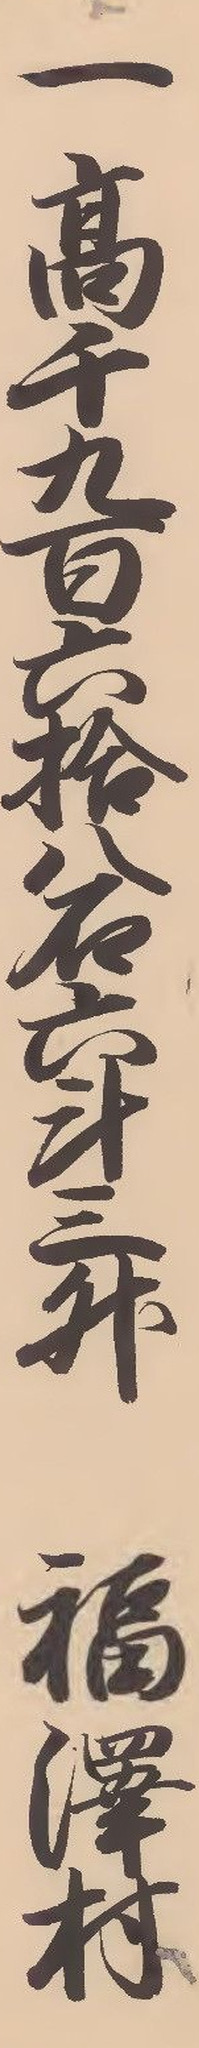一高千九百六拾八石六斗三升福沢村
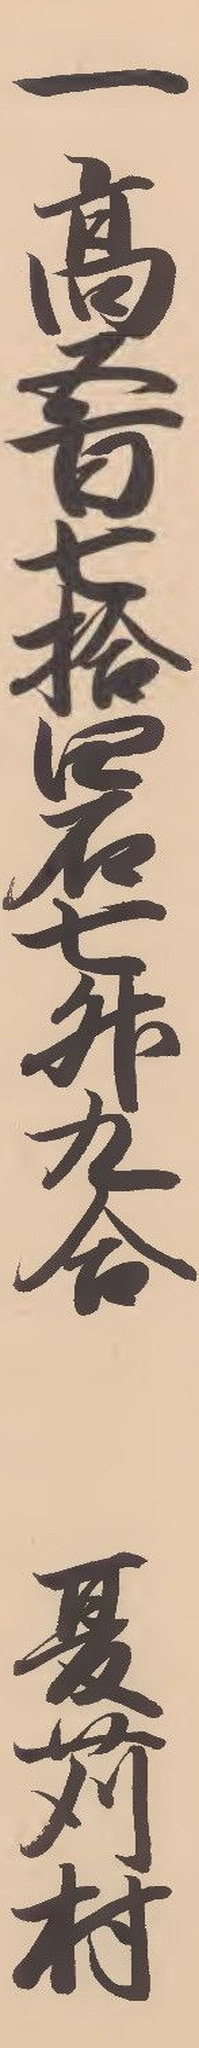一高五百七拾四石七升九合夏苅村
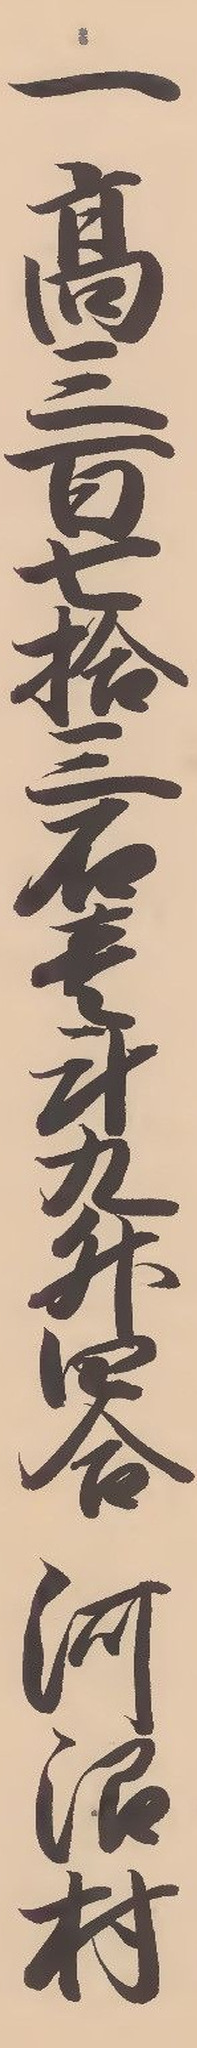一高三百七拾三石壱斗九升四合河沼村

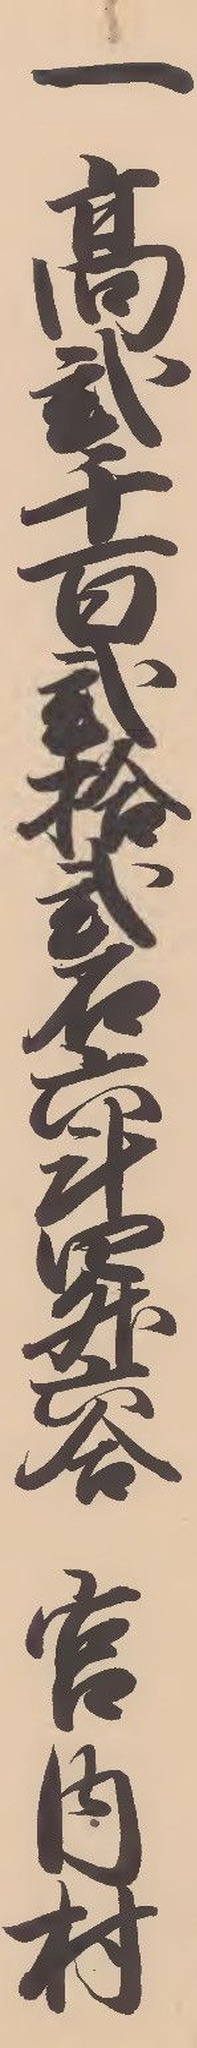一高弐千百弐拾弐石六斗四升六合宮内村
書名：出羽国郷帳　１
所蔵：国立公文書館 National Archives of Japan
